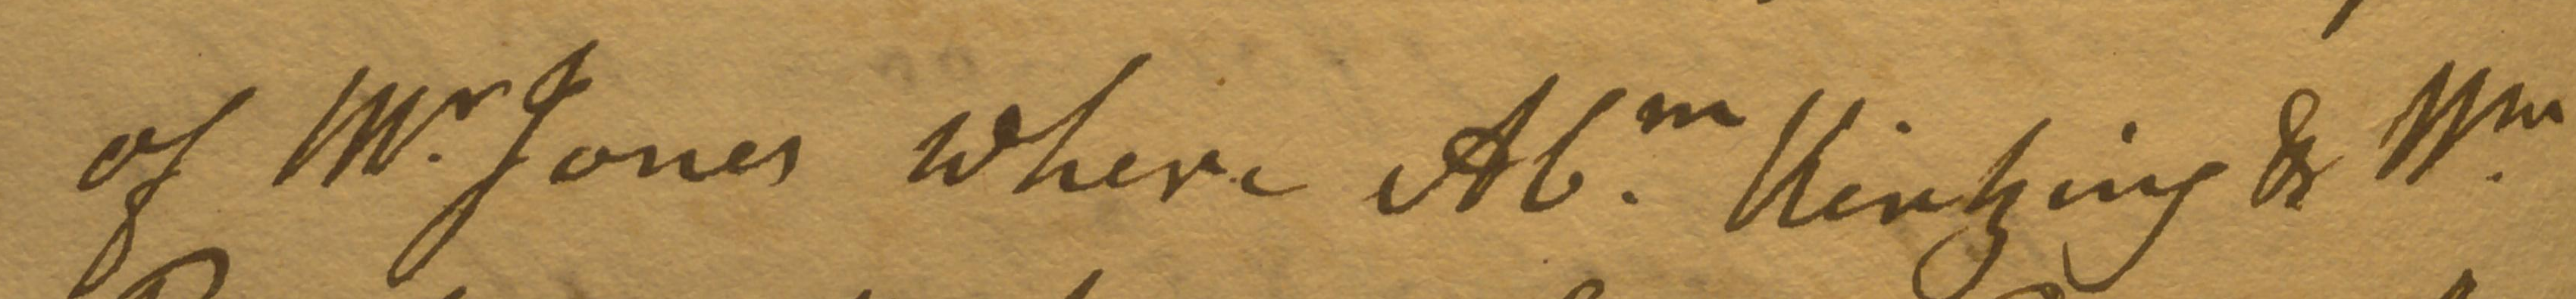of M^r. Jones where Ab^m. Kintzing & W^m.
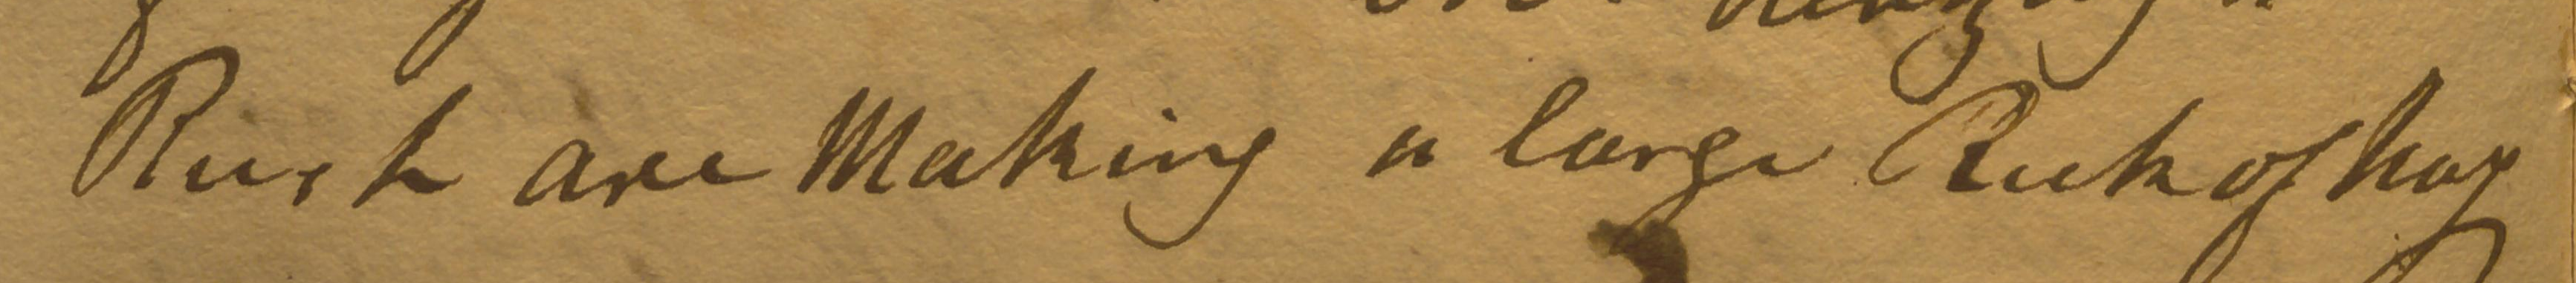Rush are Making a large Ruck of hay
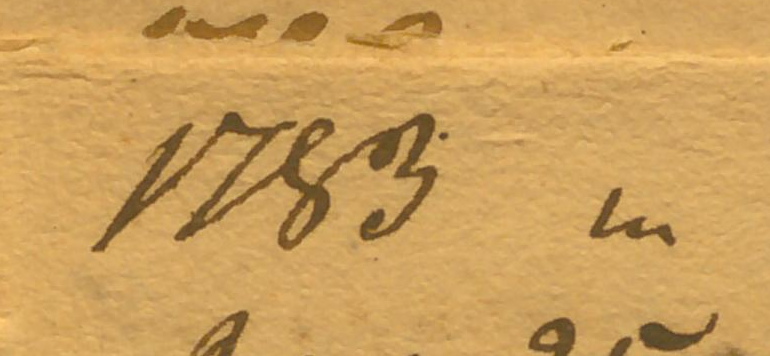1783
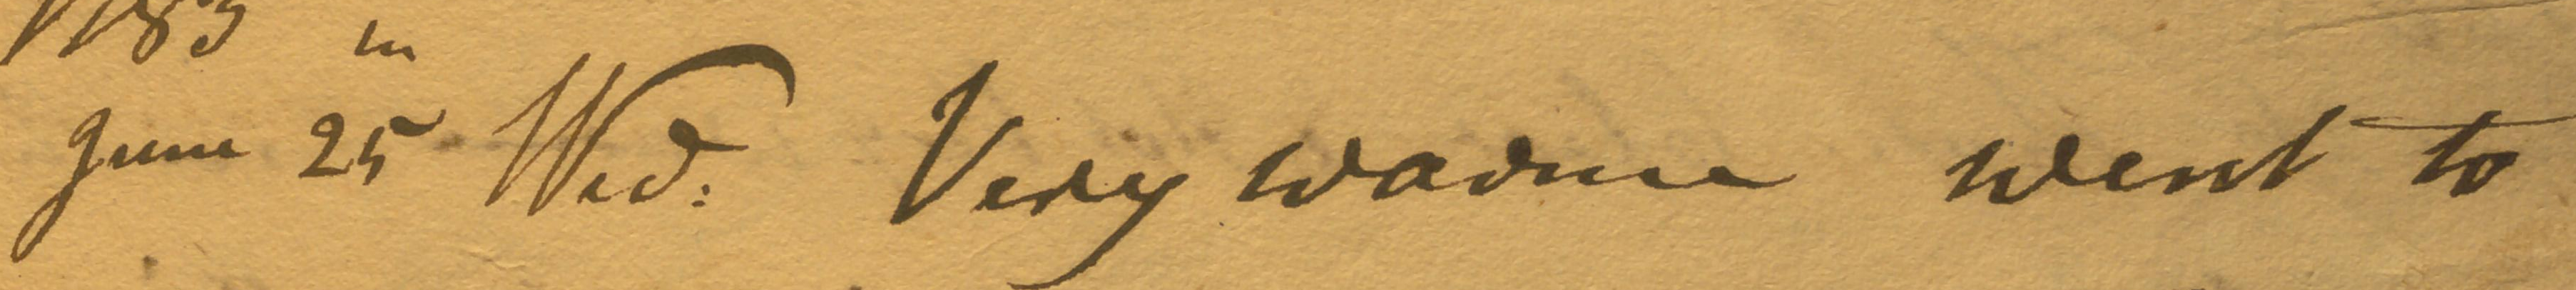June 25^th Wed. Very warme, went to
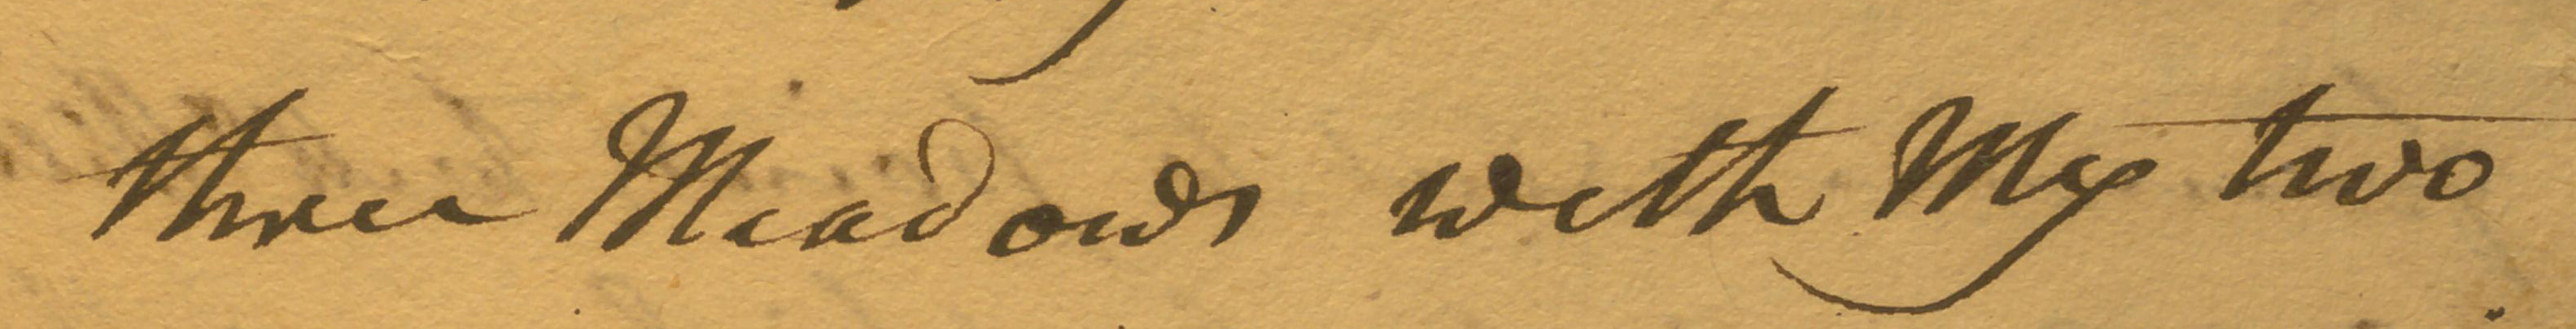three Meadows with My two
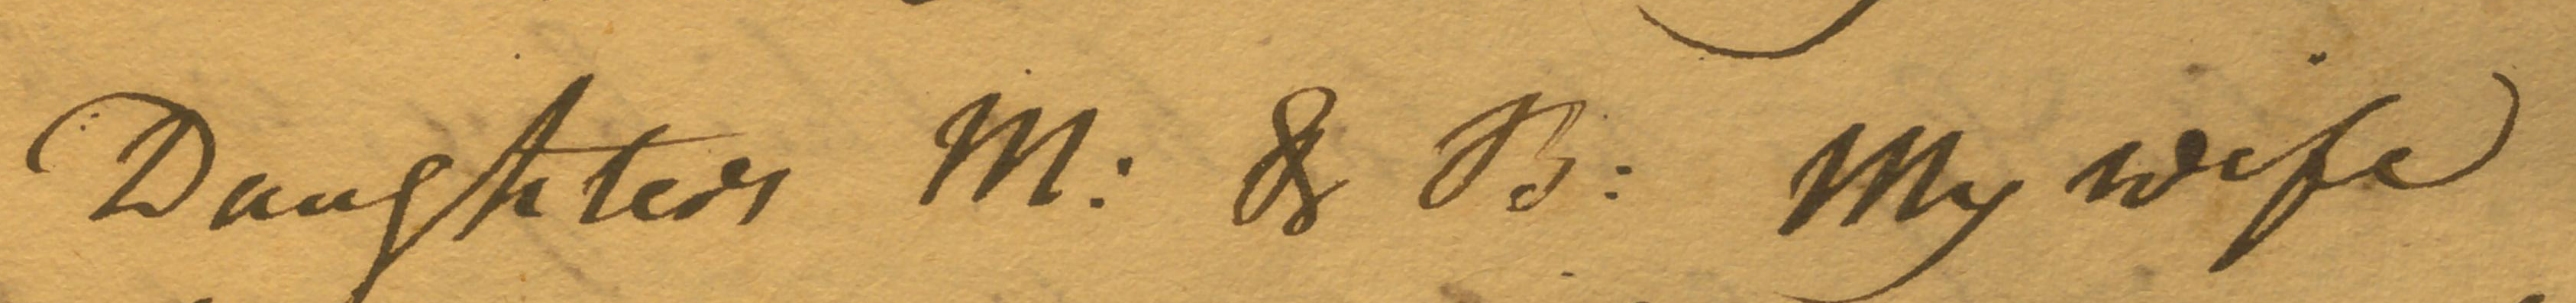Daughters M: & B. My wife
